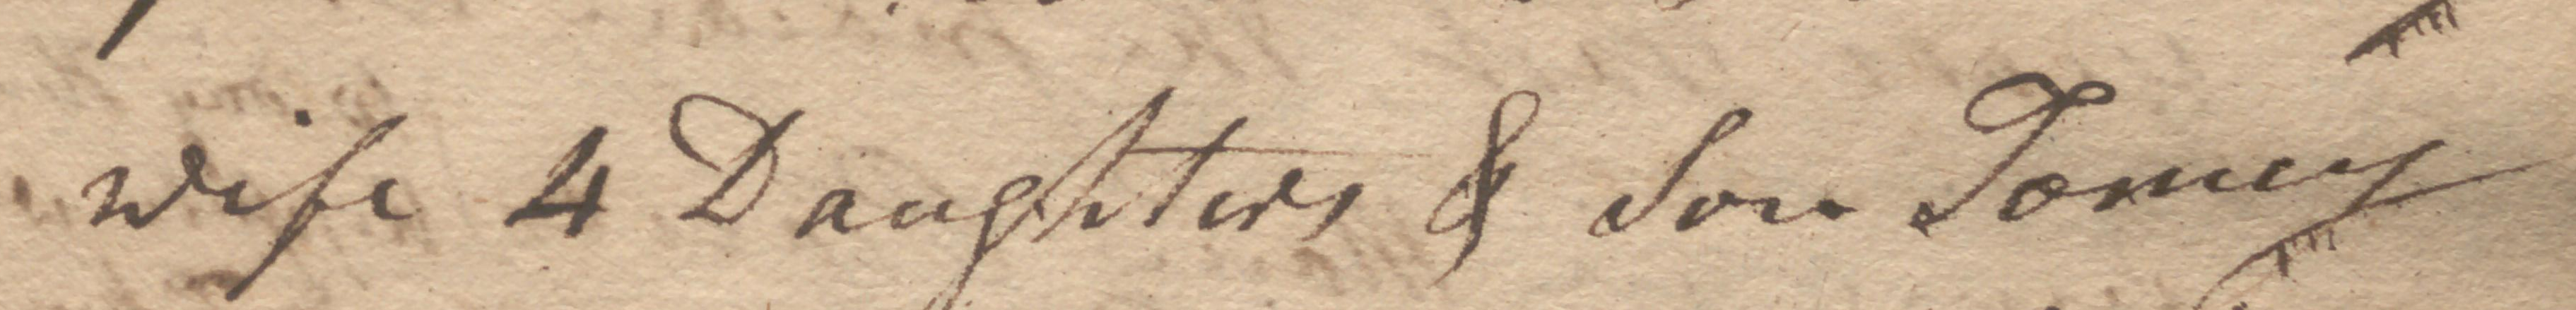wife 4 Daughters & son Tomey
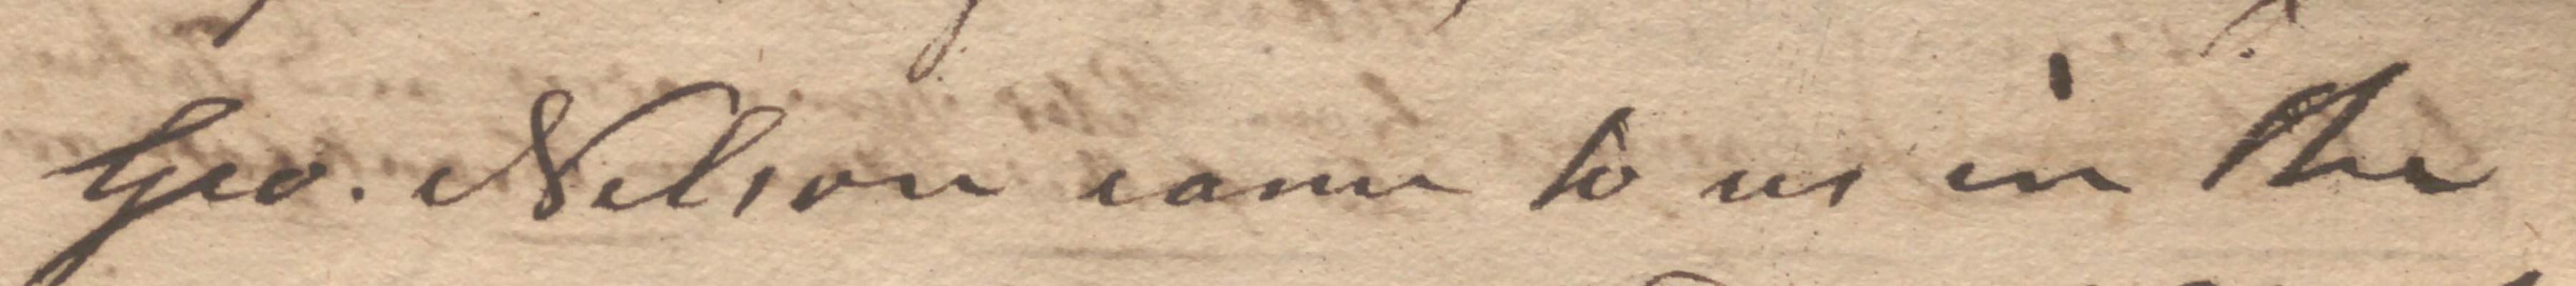Geo. Nelson came to us in the
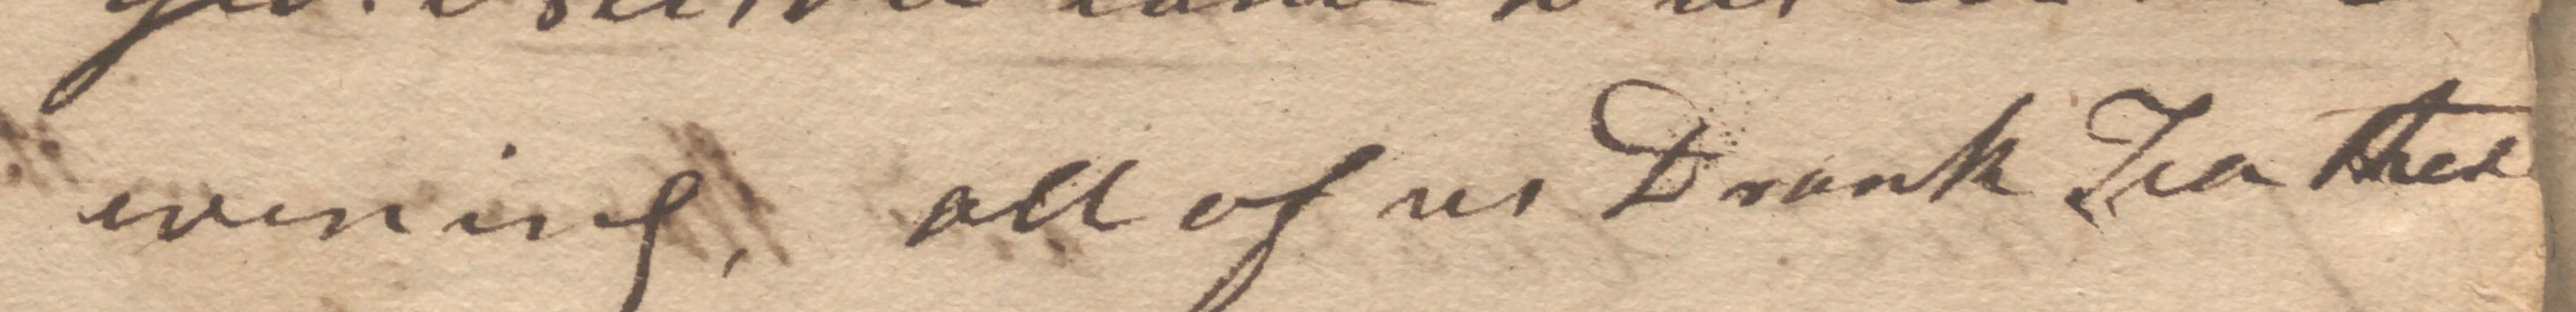evenineg, all of us Drank Tea ther
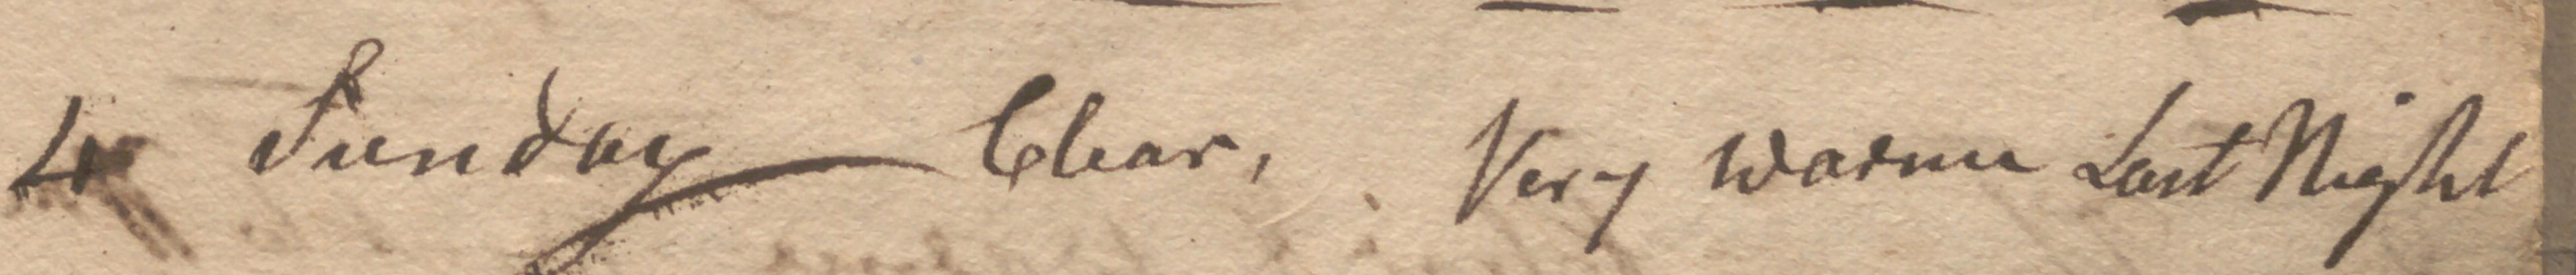4 Sunday Clear, Very warme Last Night
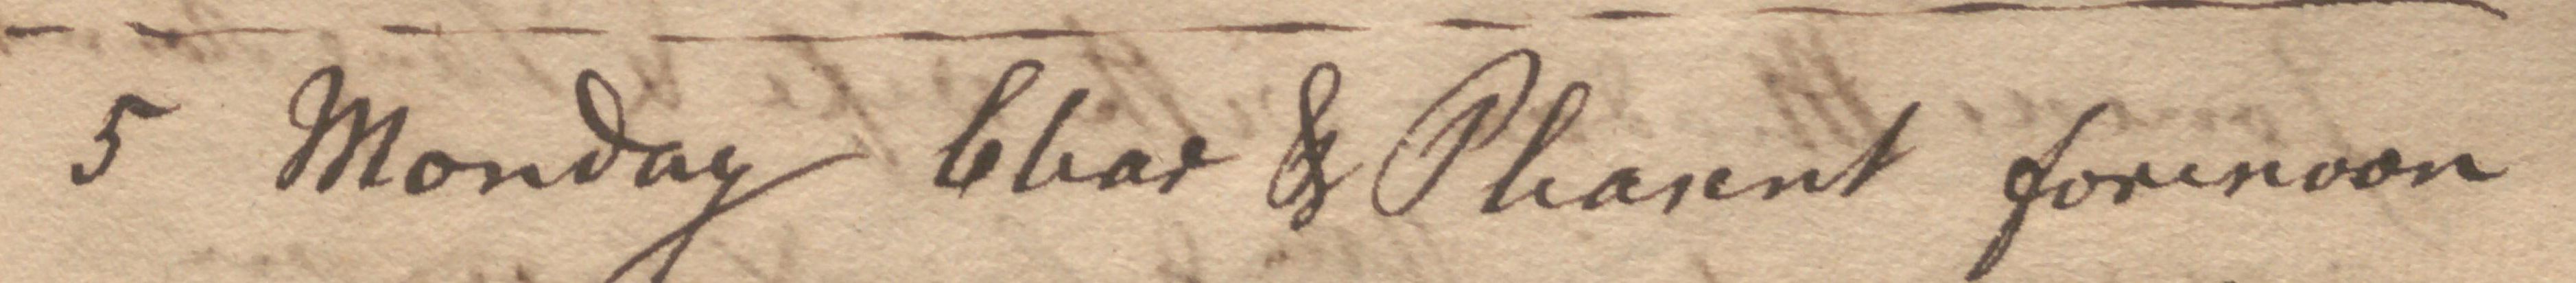5 Monday Clear & Pleasent forenoon
